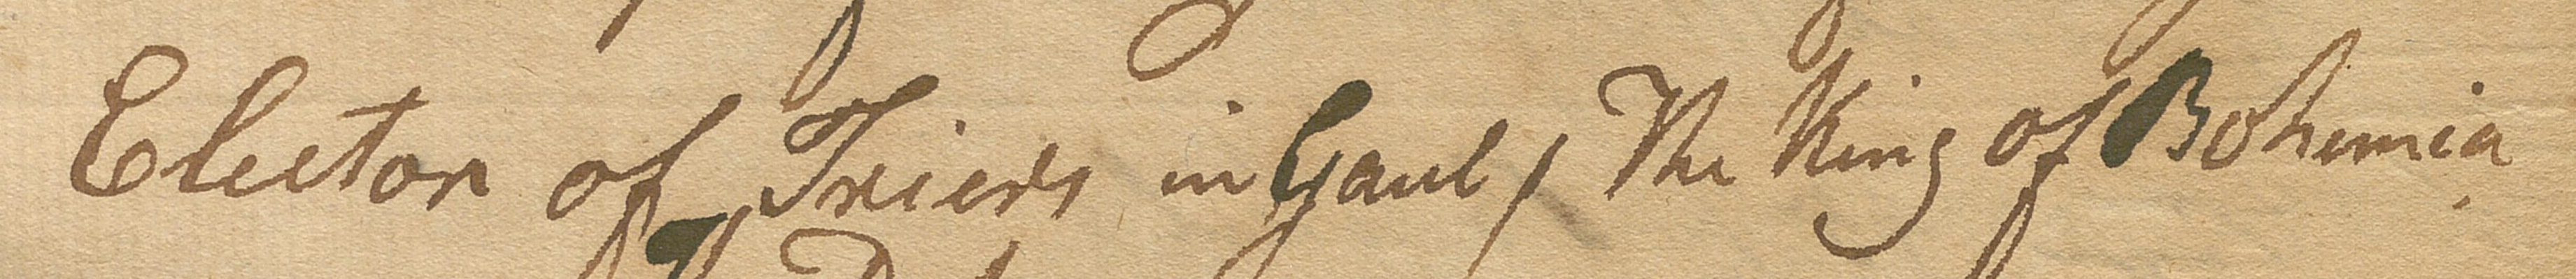Elector of Triers in Gaul / The King of Bohemia
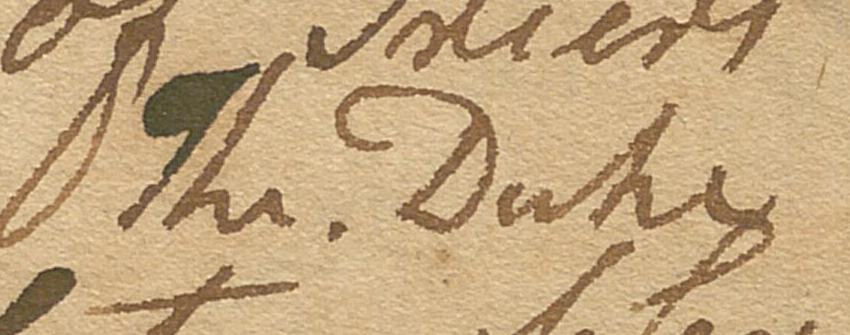The. Duchy
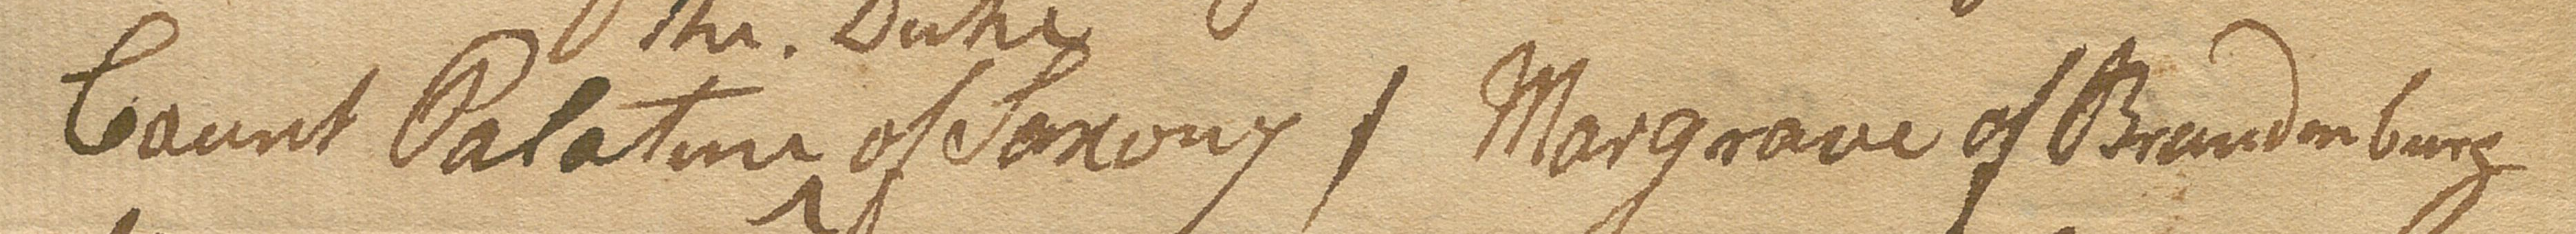Count Palatine ^ of Saxony / Margrave of Brandenburg
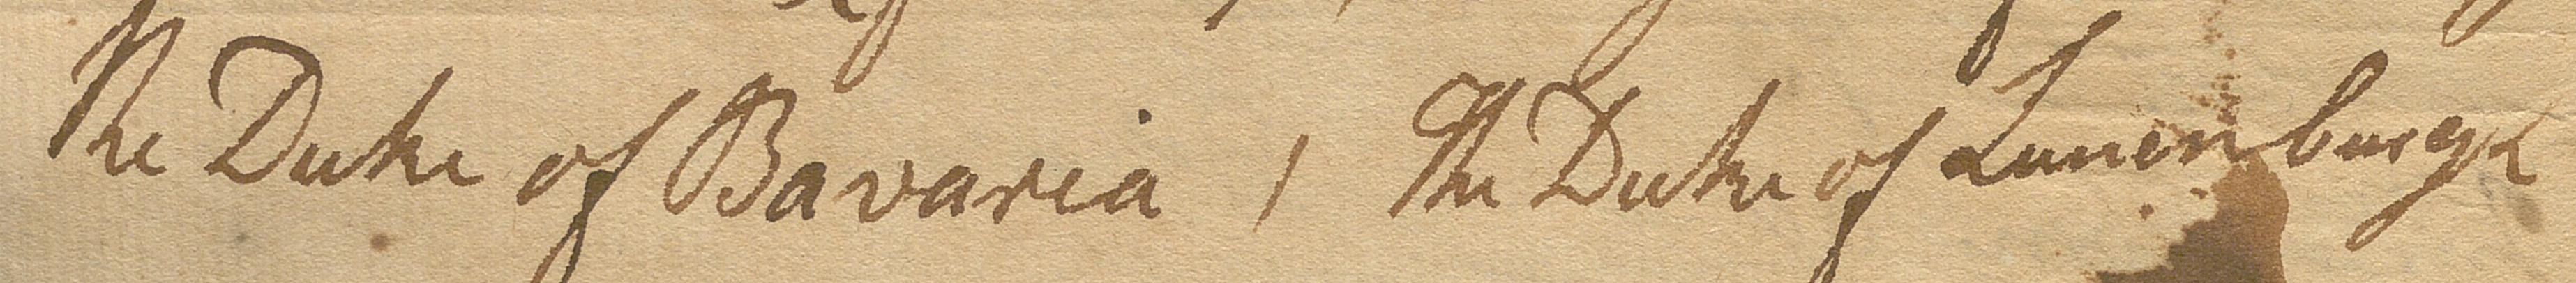The Duke of Bavaria, The Duke of Lunenburgh
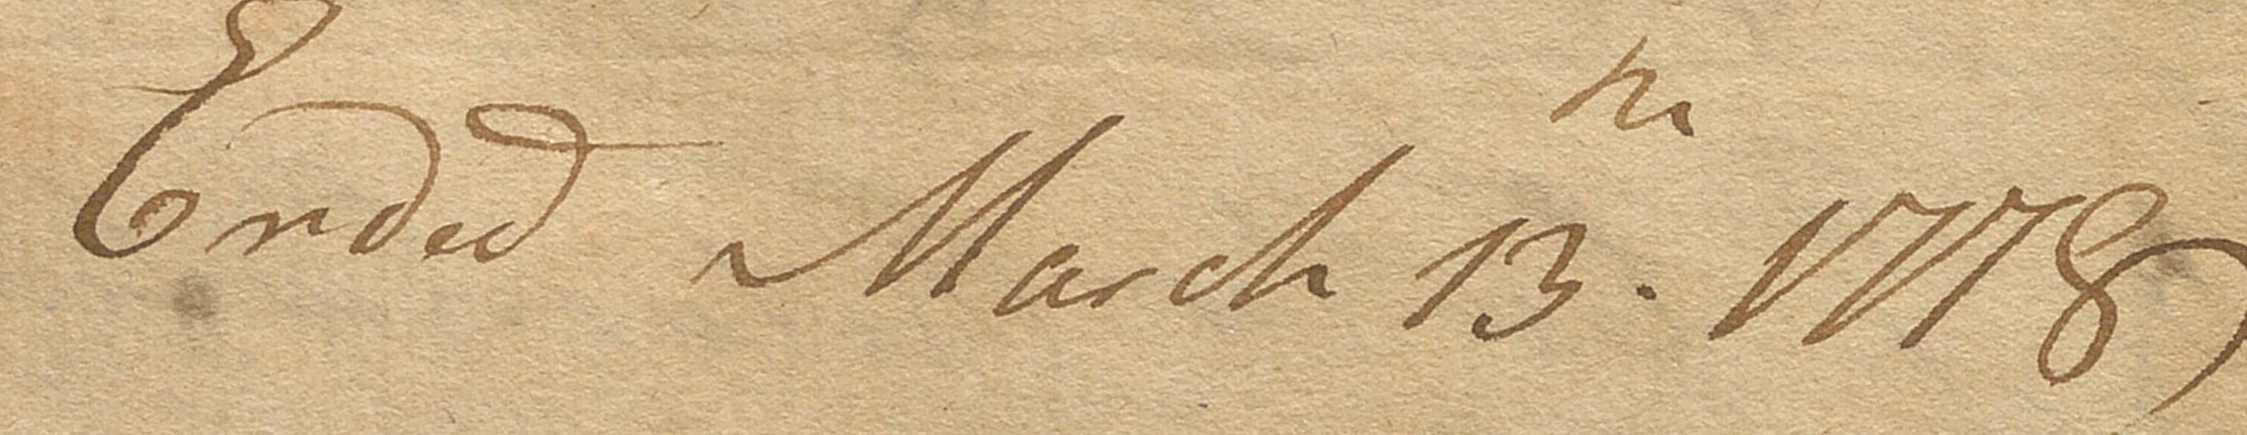Ended March 13^th. 1778
